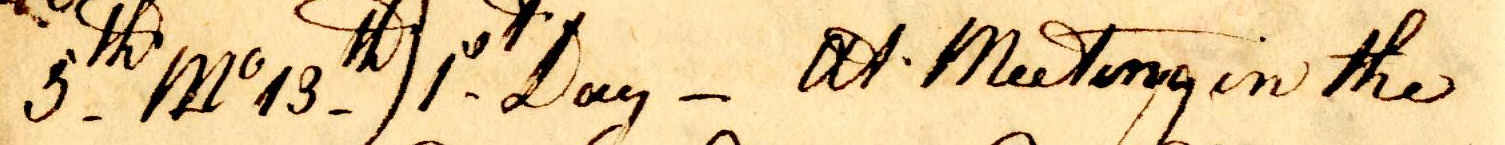5^th M^o 13^th) 1^st Day- At Meeting in the
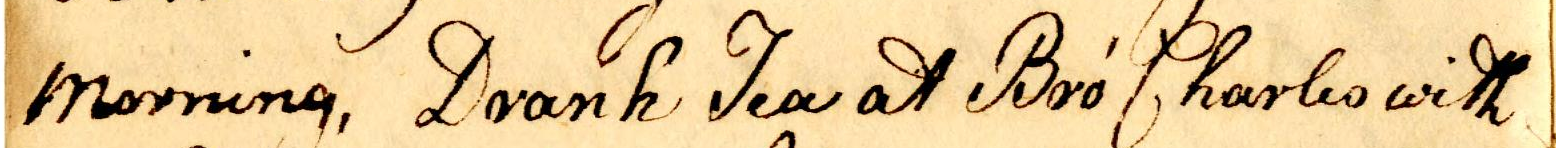Morning, Drank Tea at Bro' Charles with
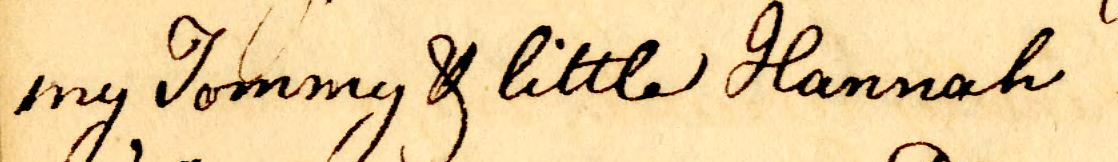my Tommy & little Hannah
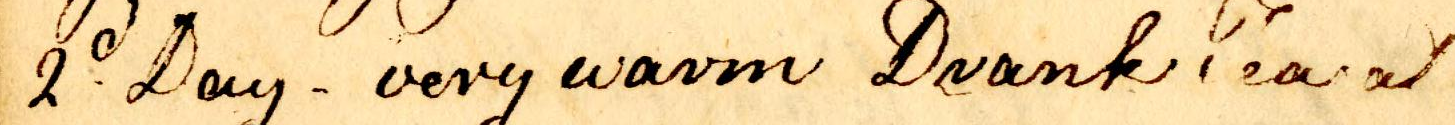2^d. Day- very warm Drank Tea at
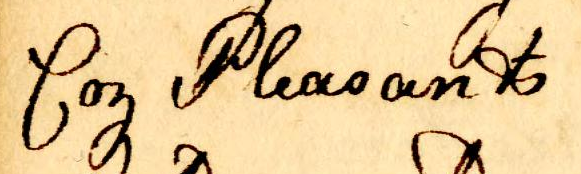Coz Pleasants
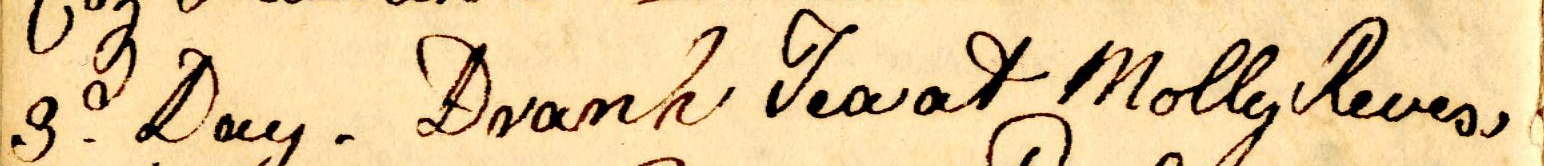3^d. Day- Drank Tea at Molly Reves,
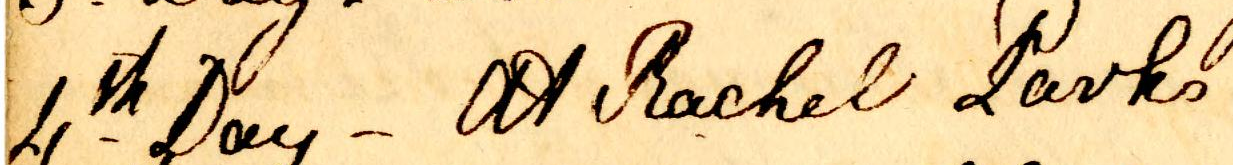4^th Day- At Rachel Parks
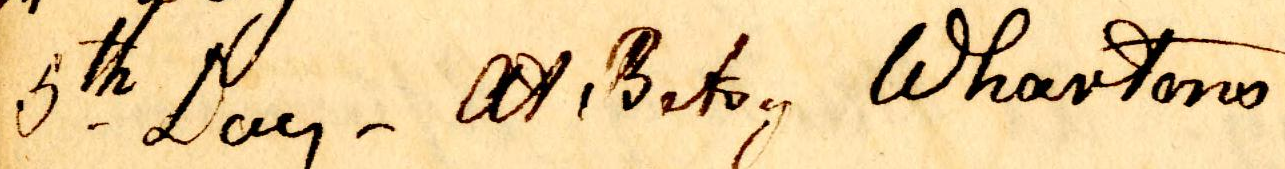5^th Day- At Betsy Whartons
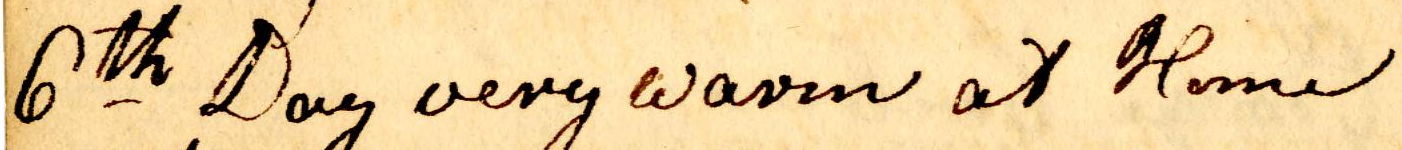6^th Day very warm at Home
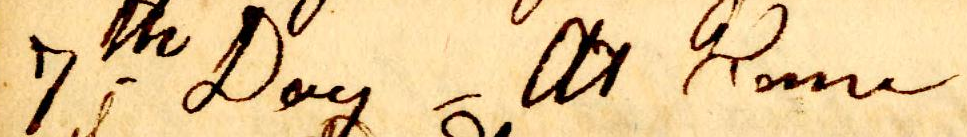7^th Day- At Home
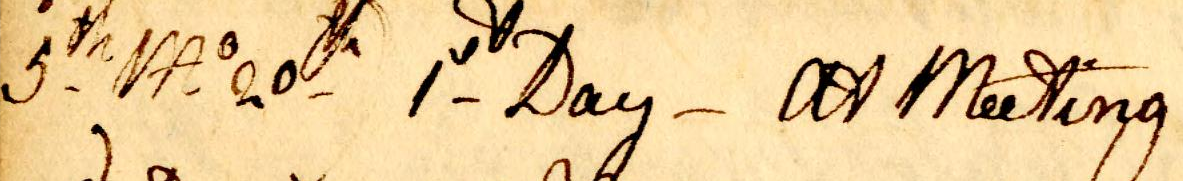5^th M^o 20^th 1^st Day- At Meeting
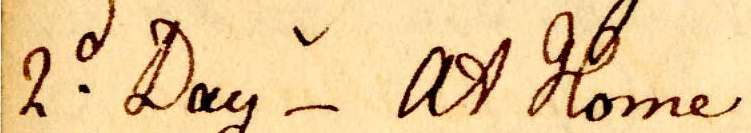2^d. Day- At Home
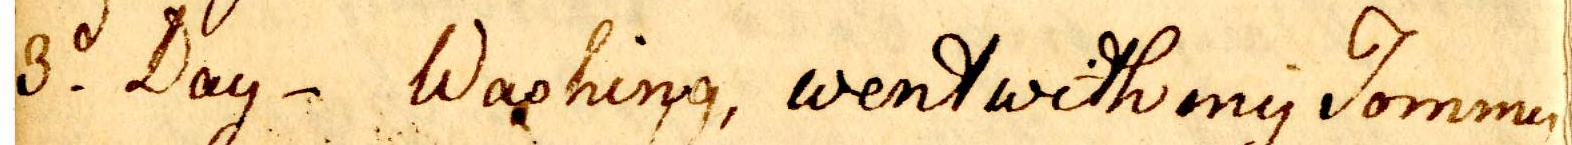3^d. Day- Washing, went with my Tommy
